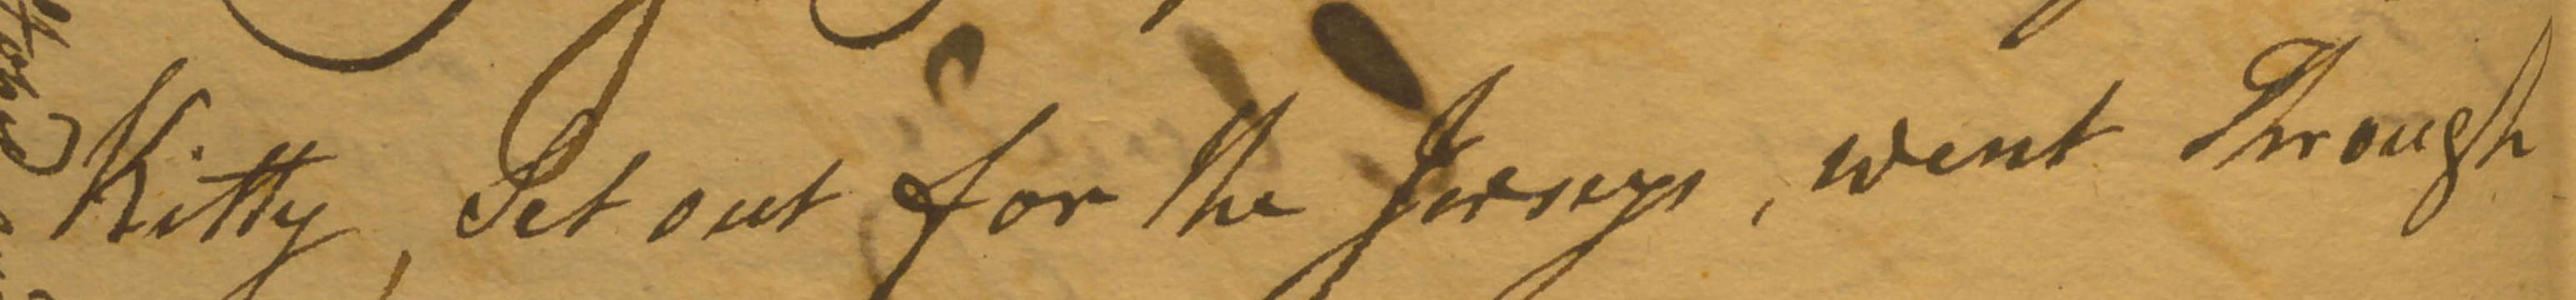Kitty set out for the Jerseys went Through
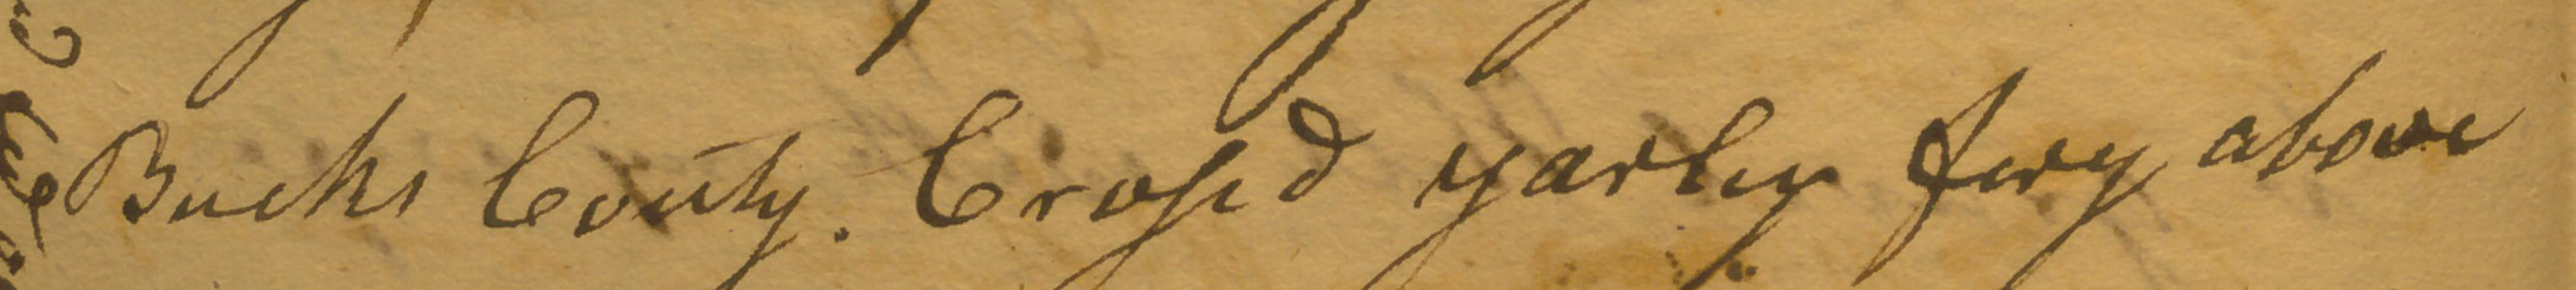Bucks Couty Crosed yarley fery above
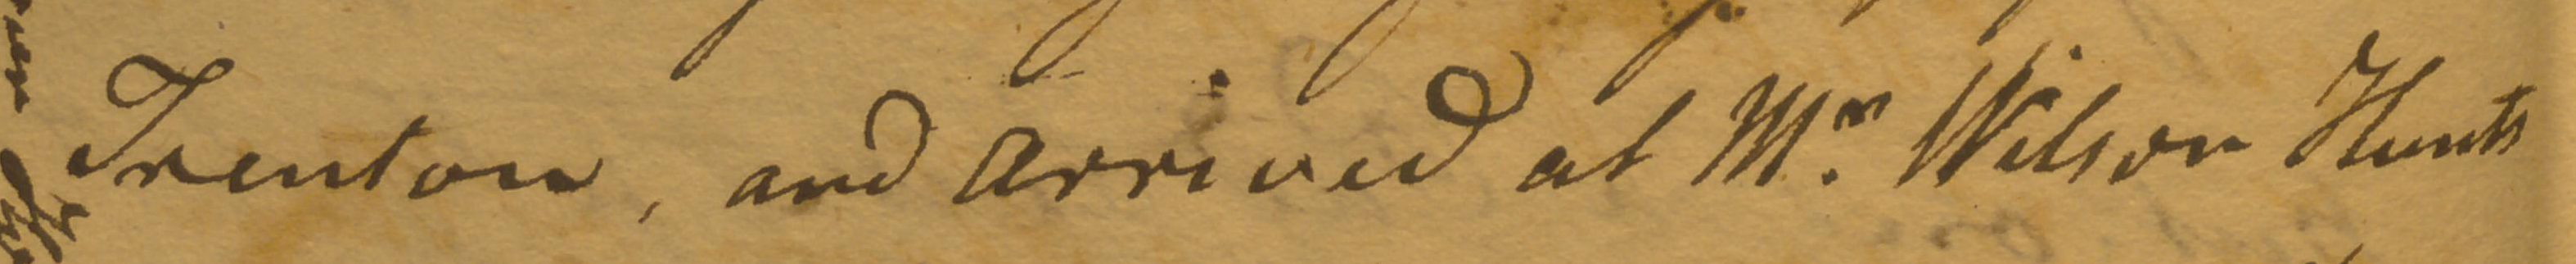Trenton, and arrived at M^r. Wilson Hunts
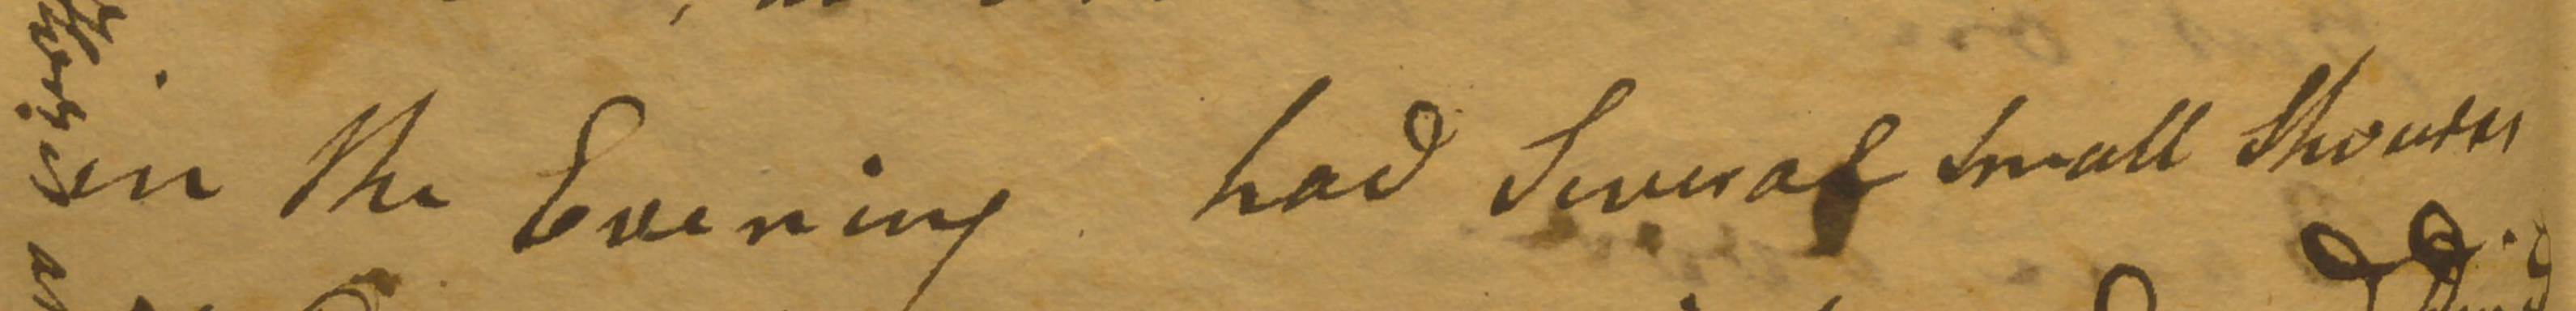in the Evening had Several small Shoures
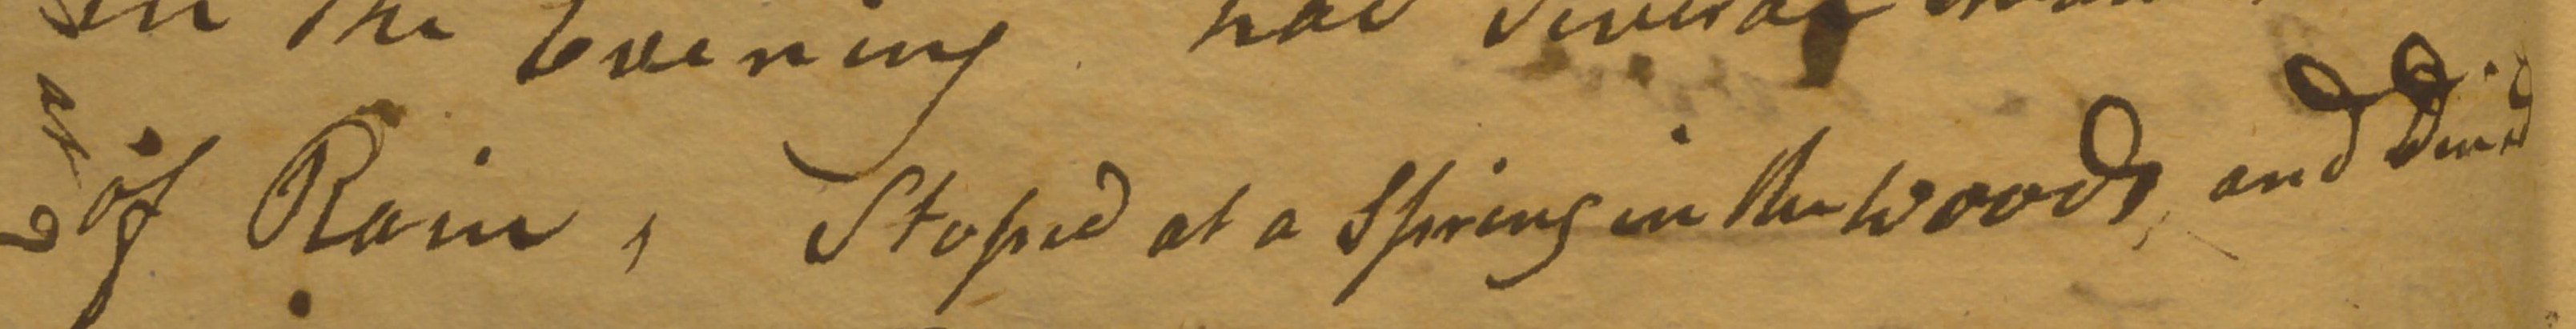of Rain, Stoped at a Spring in the Woods, and Dine
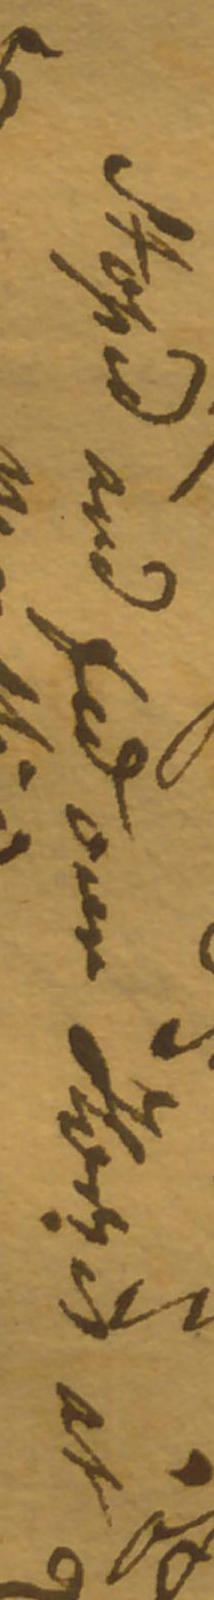Stoped and fed our Horses at
